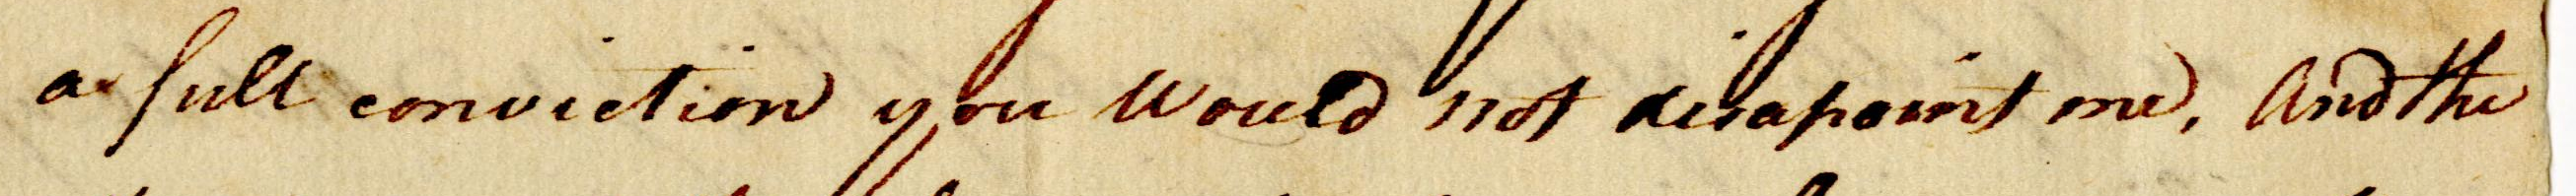a full conviction you Would not disappoint me, And the
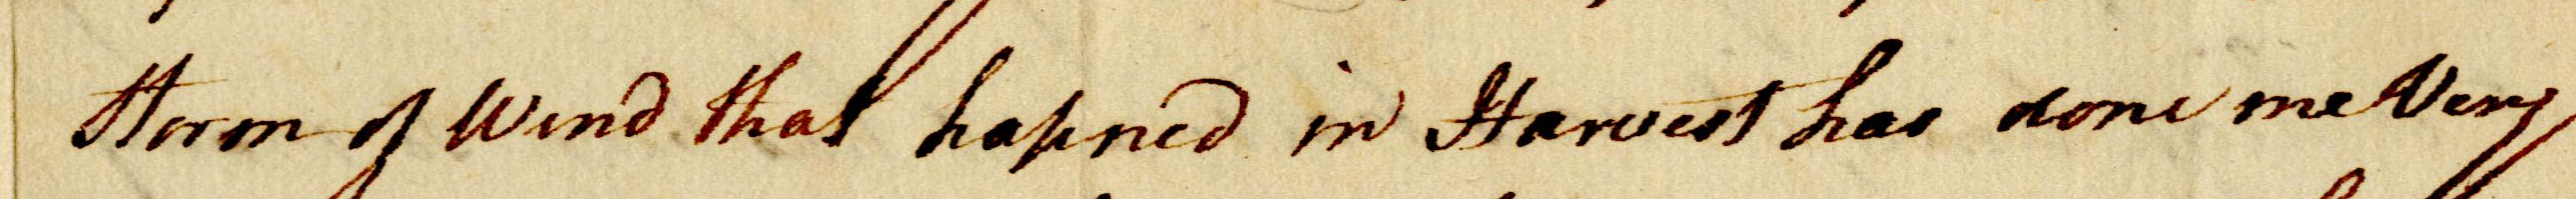Storm of Wind that hapned in Harvest has done me Very
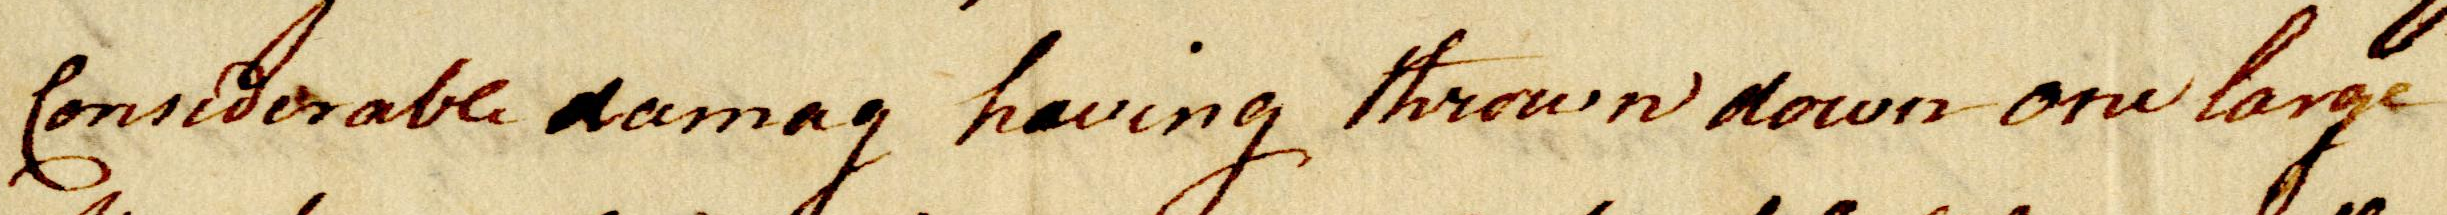Considerable damage having thrown down one large
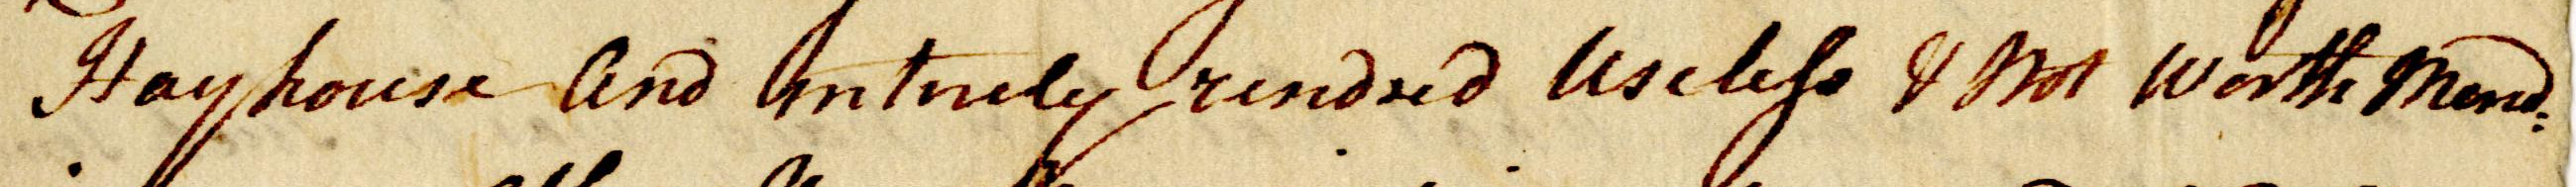Hayhouse and intirely rendred Useless & not Worth Mend-
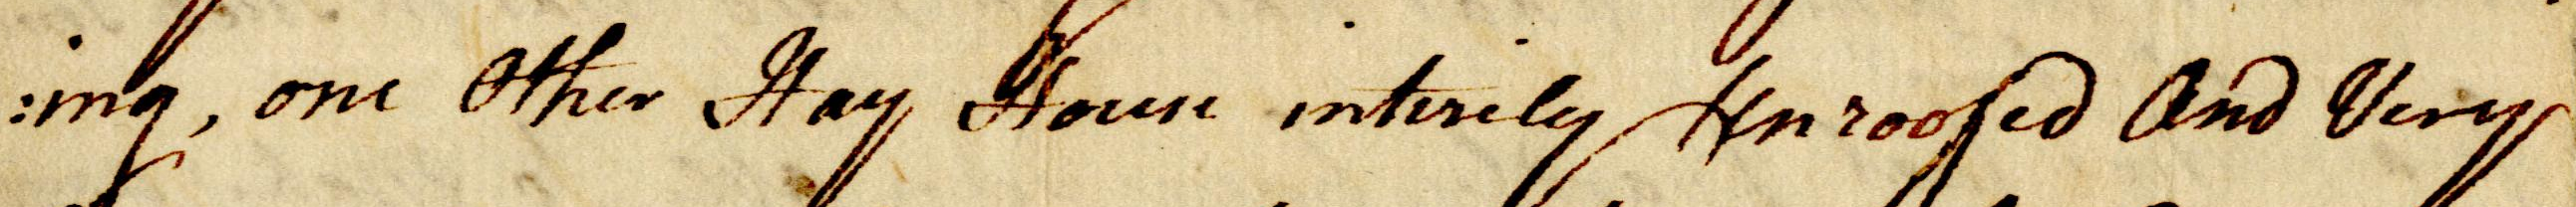-ing, one other Hay House intirely Unroofed And Very
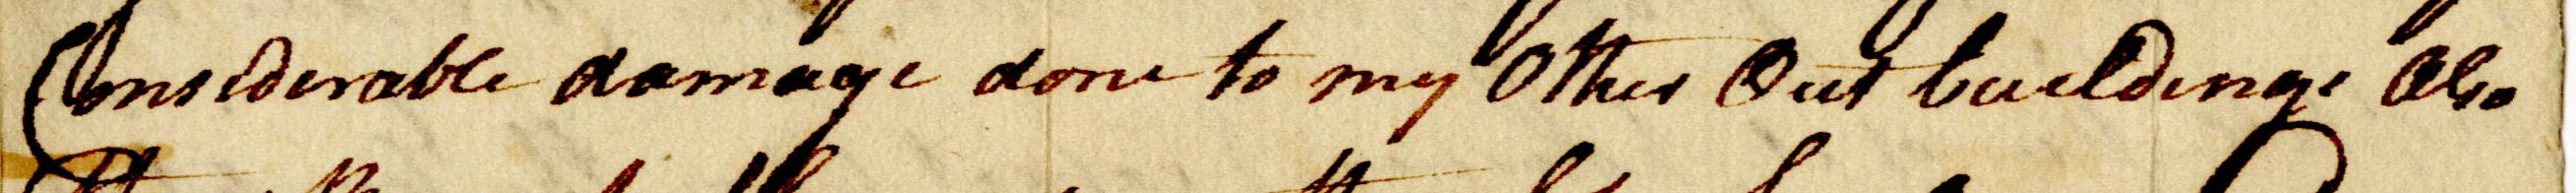considerable damage done to my Other Out building, also
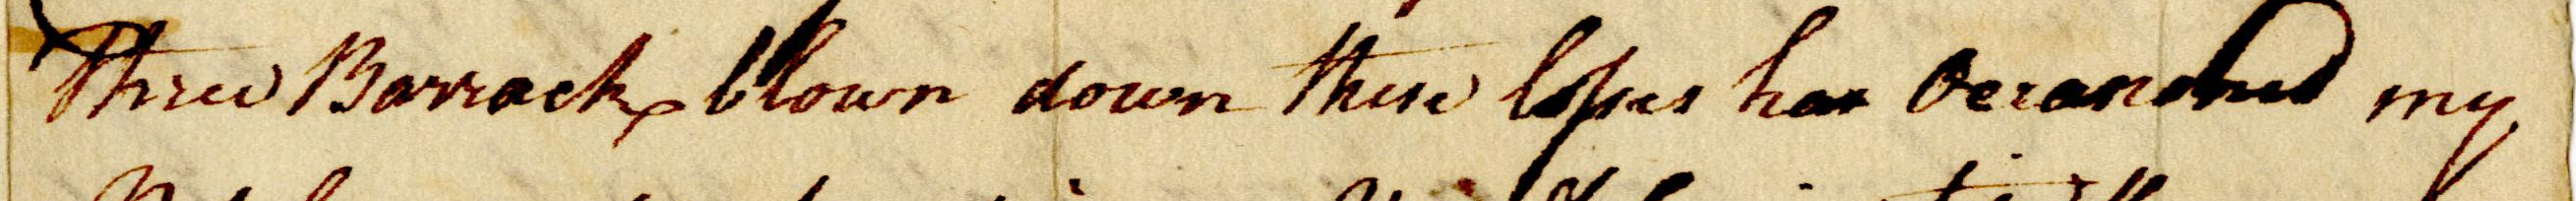three Barracks blown down these loses has Occasioned my
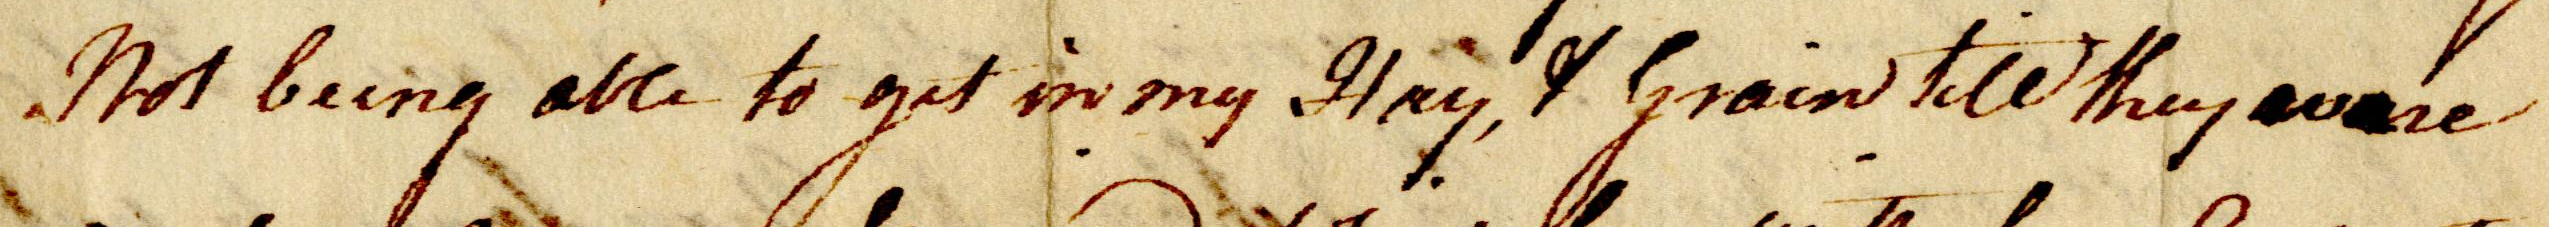Not being able to get in my Hay, & Grain till they were
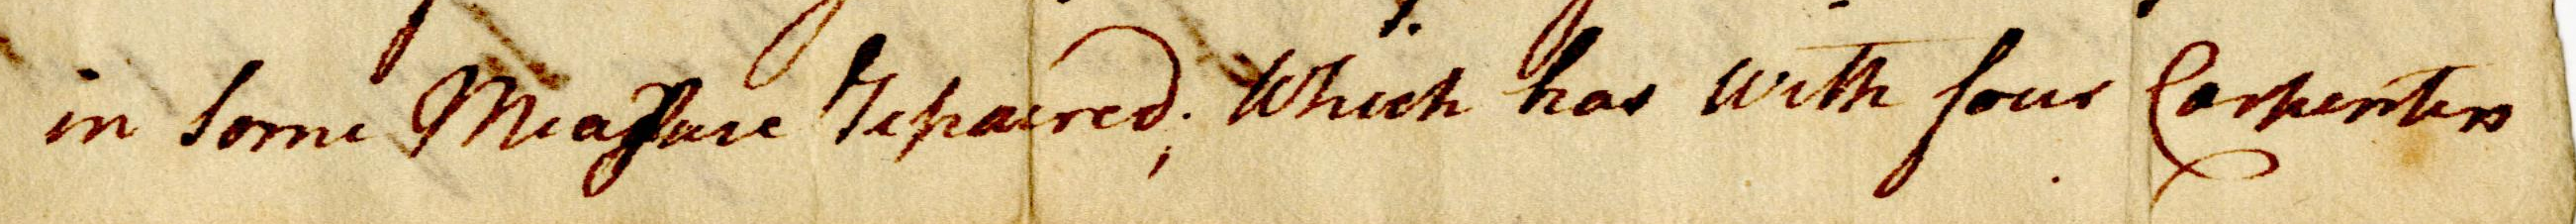in some Measure repaired, Which has with four Carpenters
